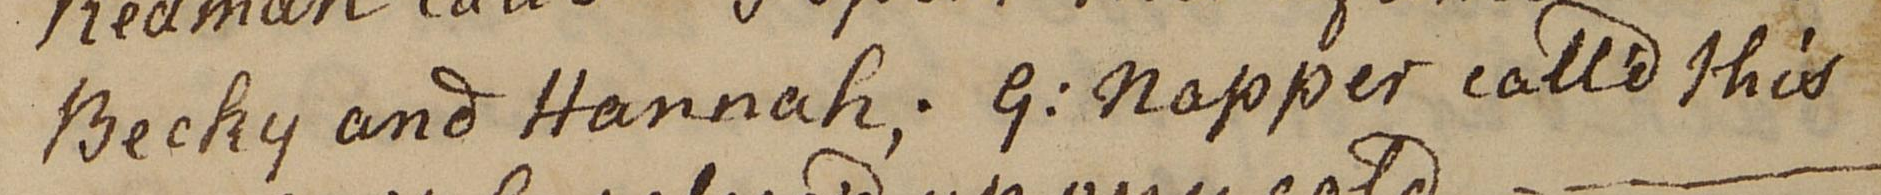Becky and Hannah; G: napper call'd this
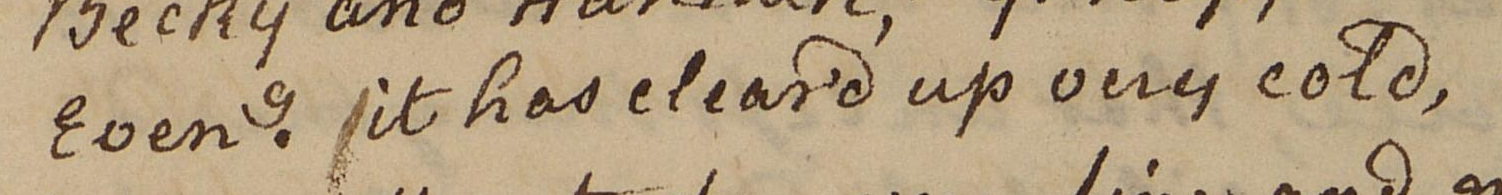Even^g. it has clear'd up very cold, -
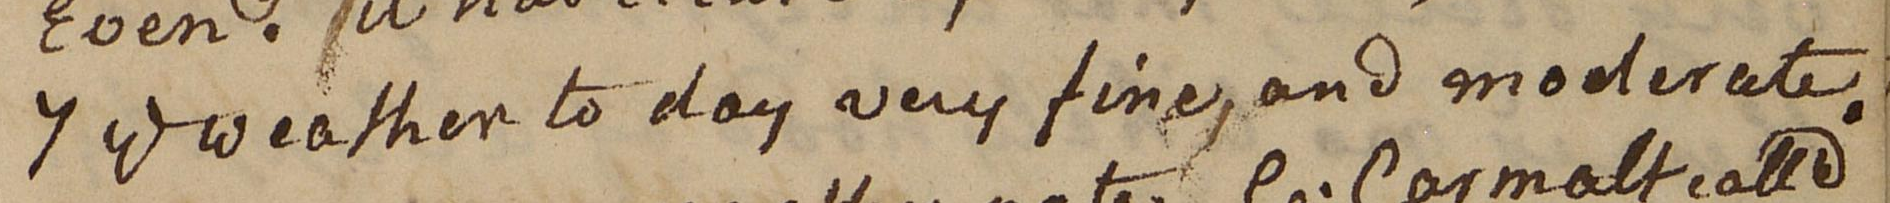7 y^e weather to day very fine, and moderate.
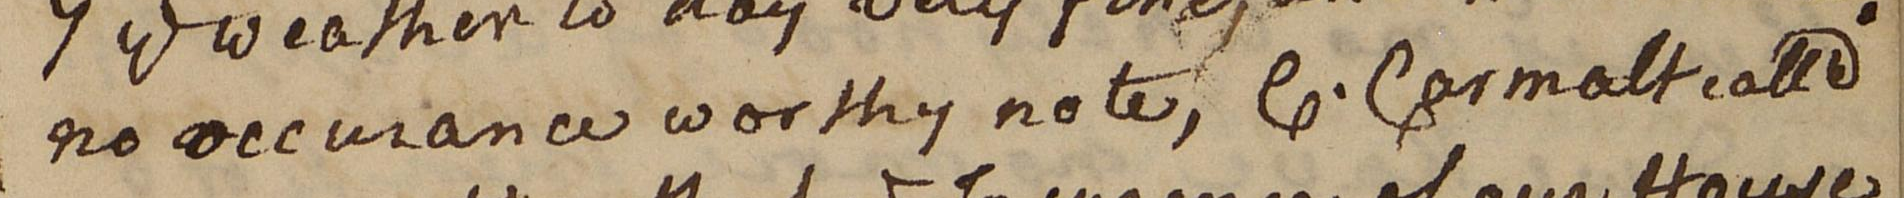no occurance worthy note, C. Carmalt call'd
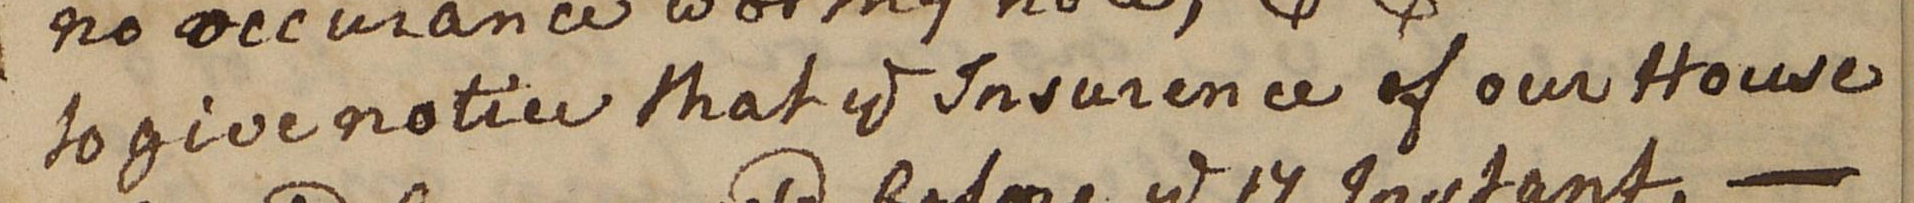to give notice that y^e Insurence of our House
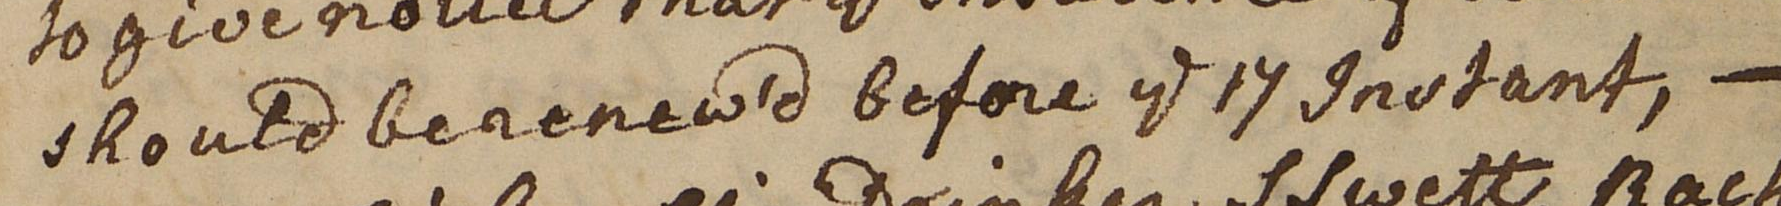should be renew'd before y^e 17 Instant,-
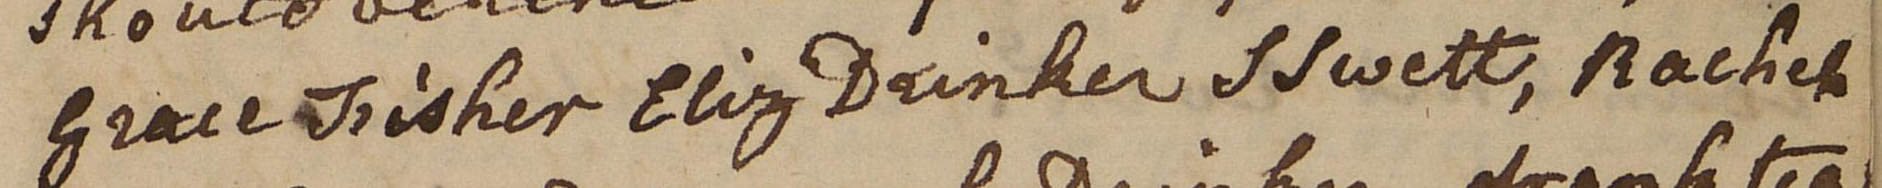Grace Fisher Eliz Drinker S Swett, Rachel
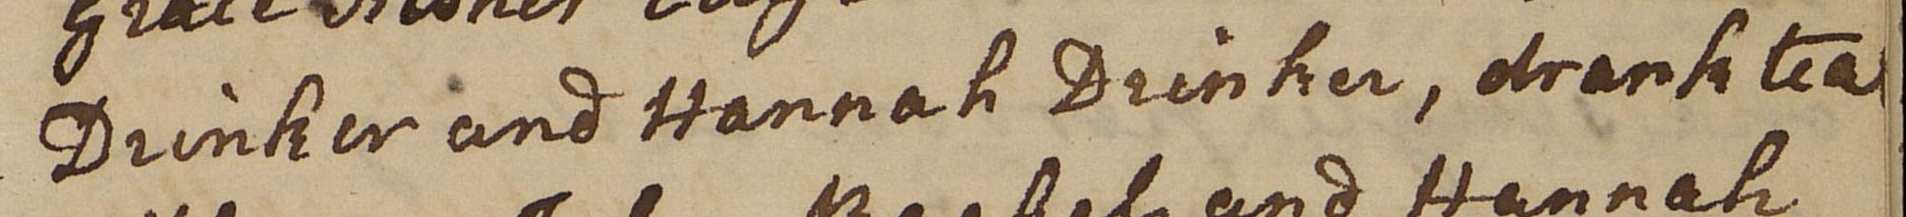Drinker and Hannah Drinker, drank tea
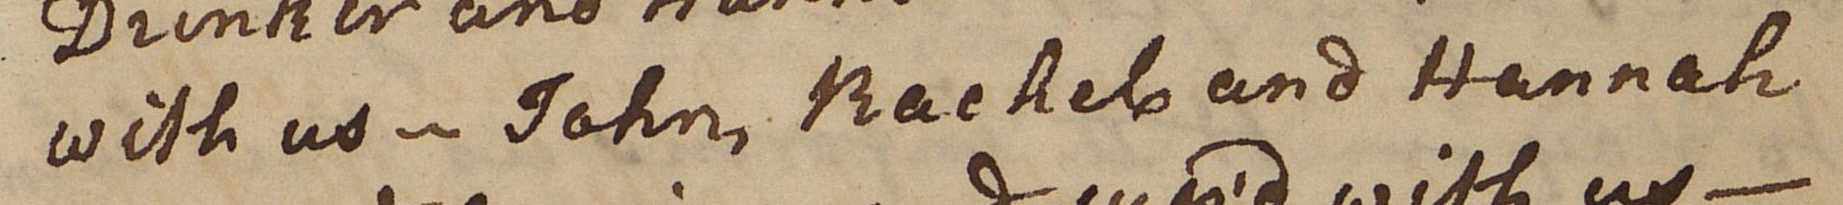with us- John, Rachel and Hannah
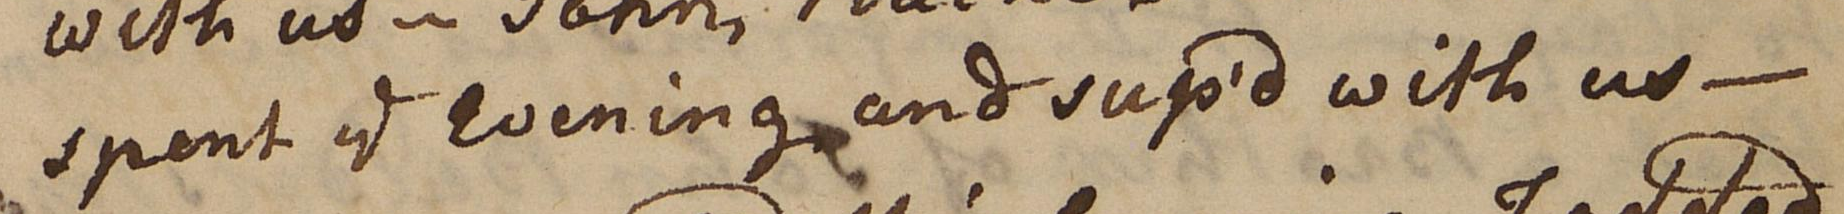spent y^e Evening and sup'd with us-
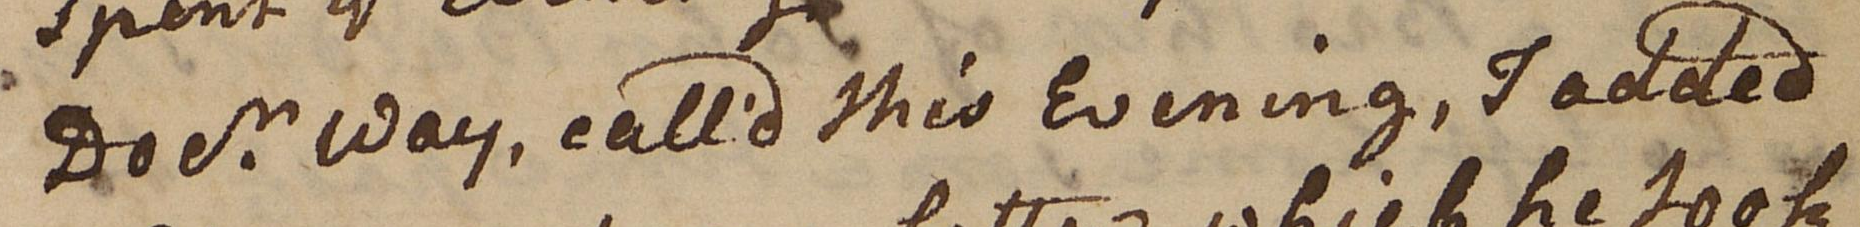Doc^r. Way, call'd this Evening, I added
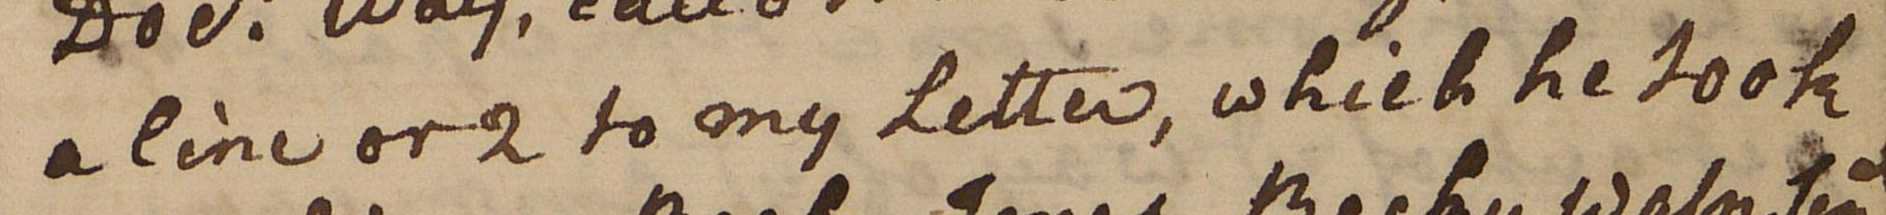a line or 2 to my Letter, which he took
